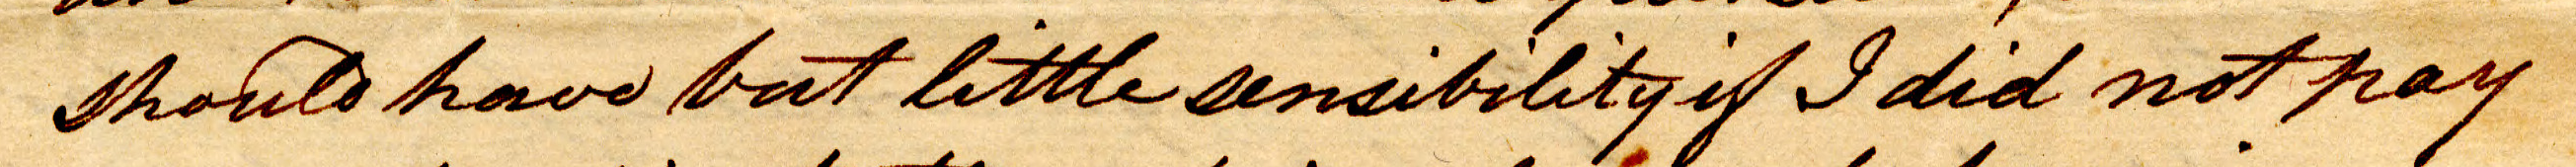should have but little sensibility if I did not pay
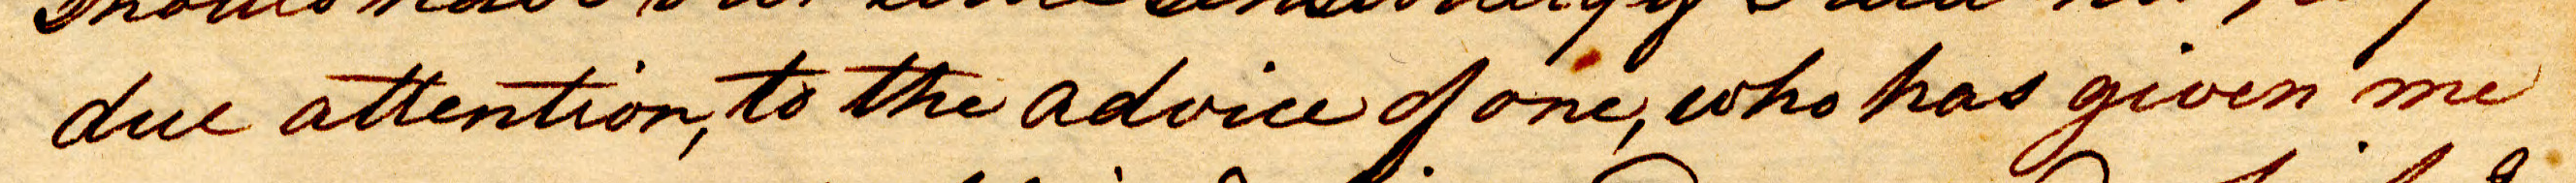due attention, to the advice of one, who has given me
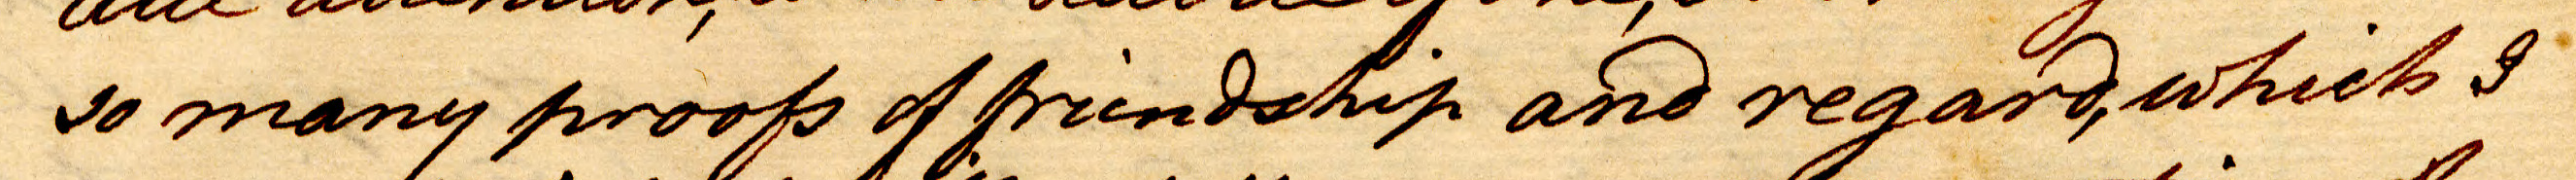so many proofs of friendship and regard, which I
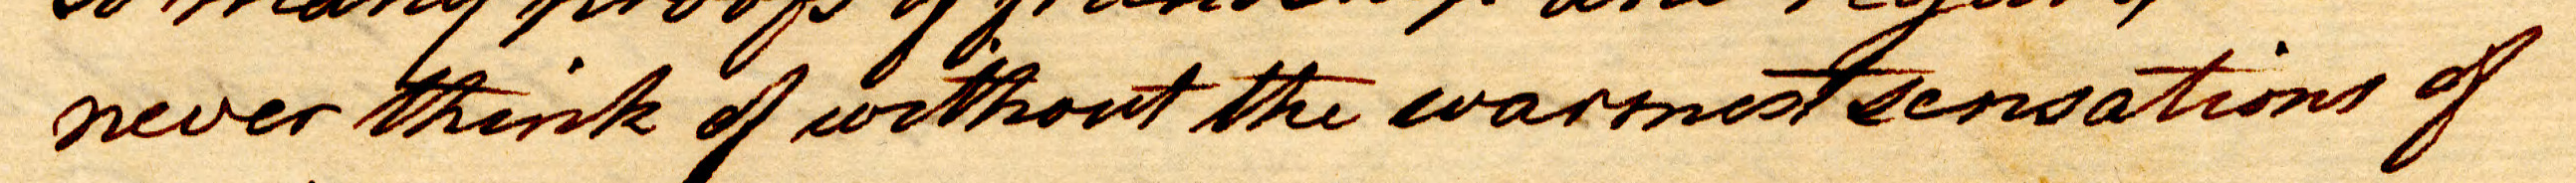never think of without the warmest sensations of
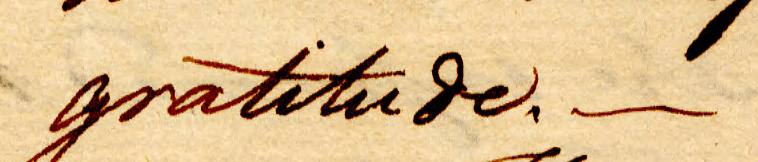gratitude &c.-
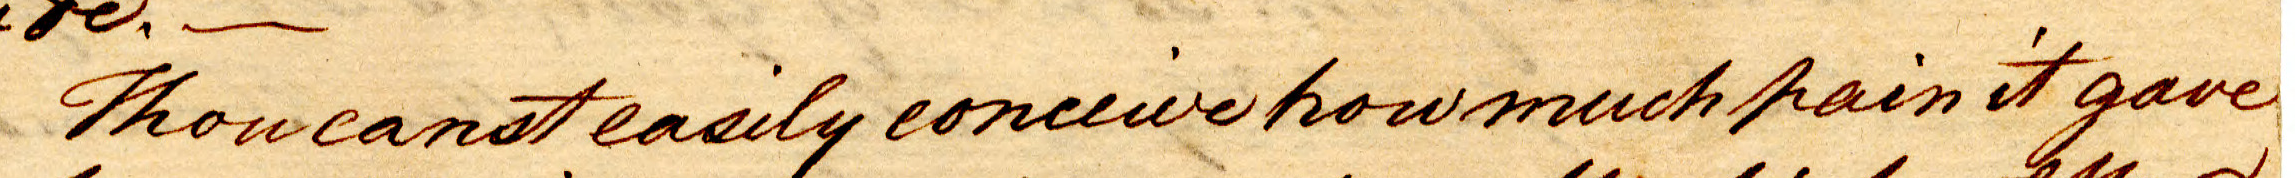Thou canst easily conceive how much pain it gave
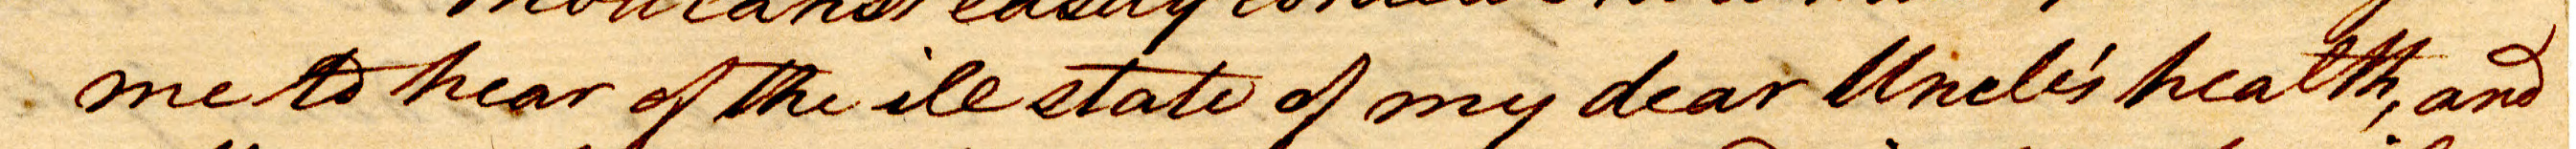me to hear of the ill state of my dear Uncle's health, and
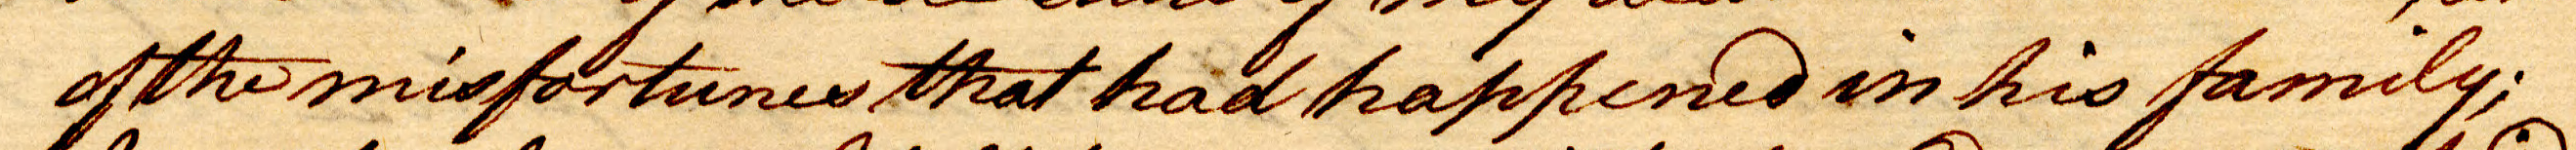of the misfortunes that had happened in his family;
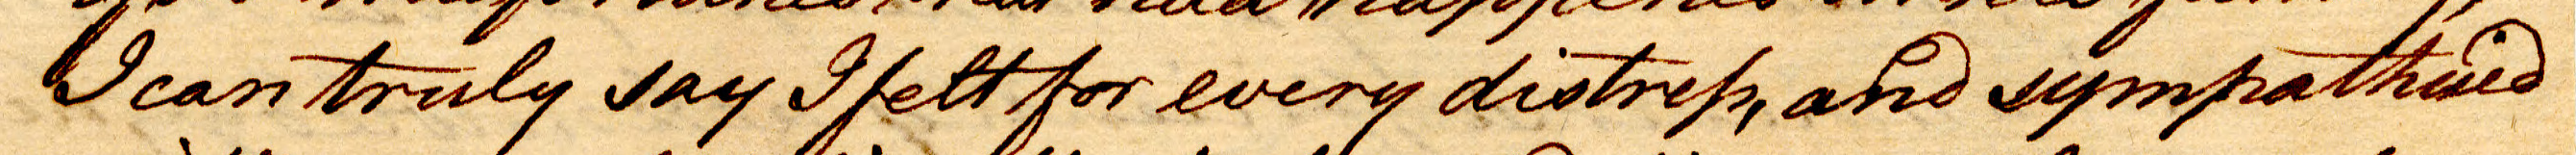I can truly say I felt for every distress, and sympathised
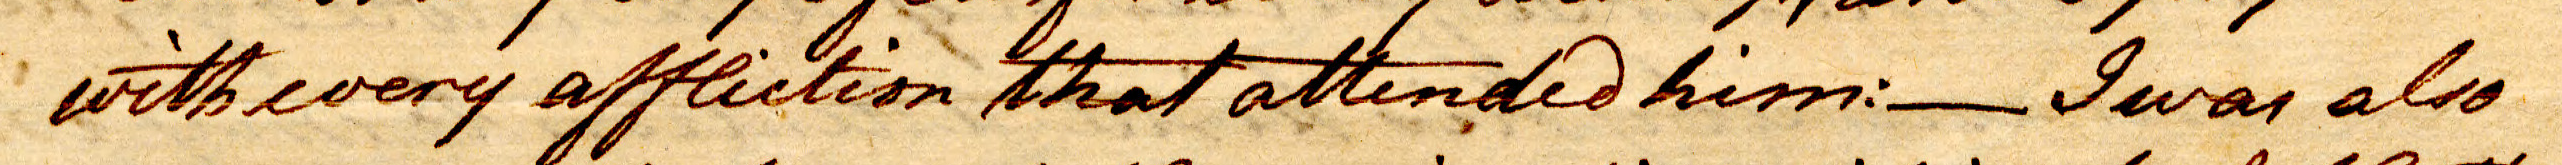with every affliction that attended him:- I was also
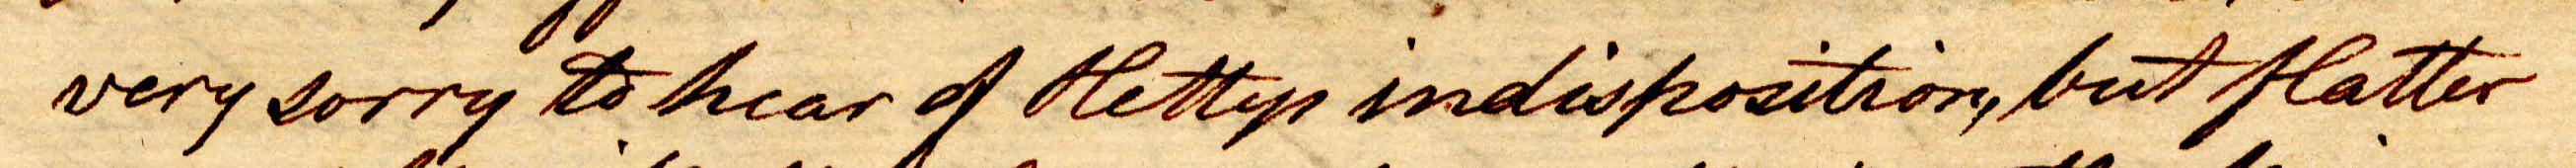very sorry to hear of Hettys indisposition, but flatter
